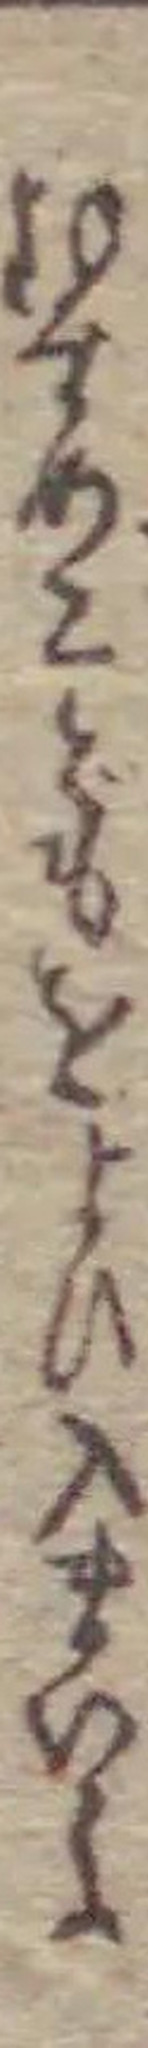むすめこどもをよひ入まいよ
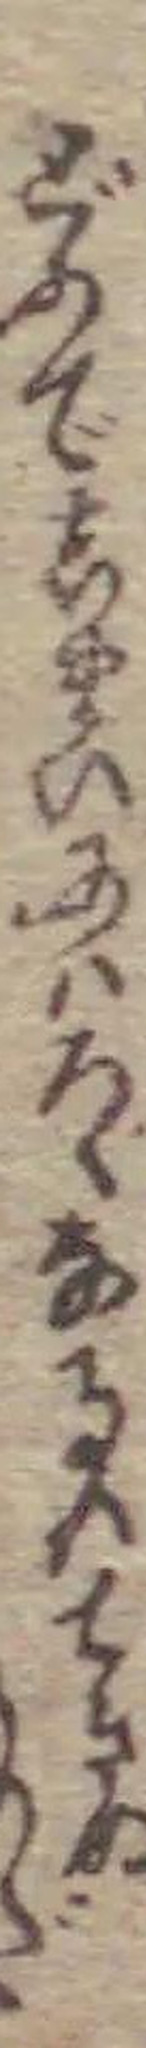どふでしまいにはろくな事もてきぬ
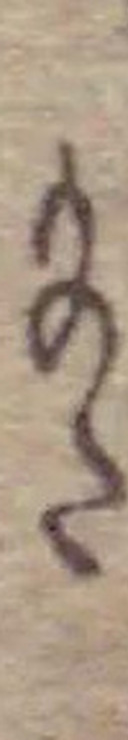ものだ

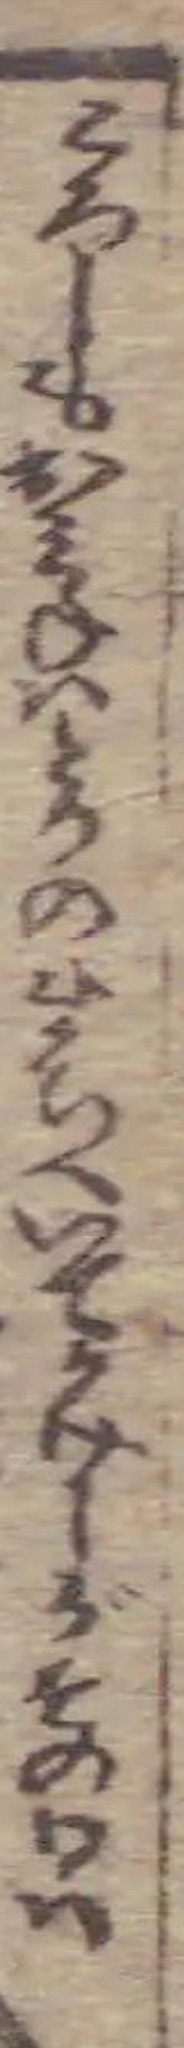ころしもおみねはとりのまちへいてかけしがそのかは
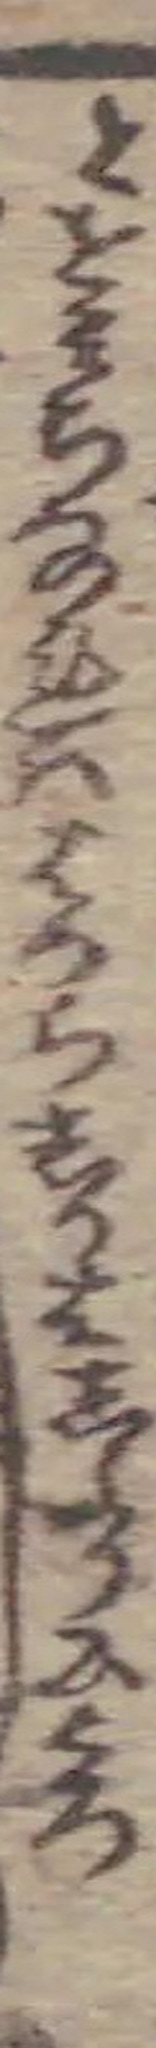とをみちなれははつちしりはしよりにくろ
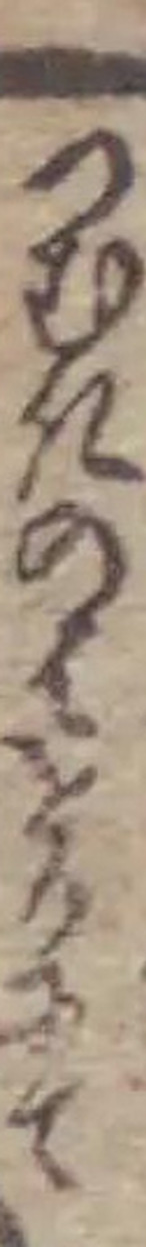つむきのはをりにて
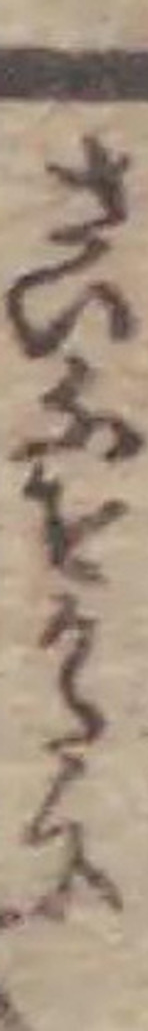さいふをかたに
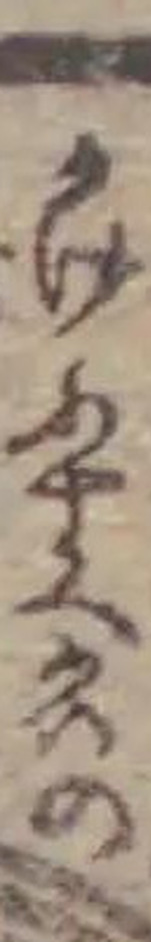かけふすへかはの
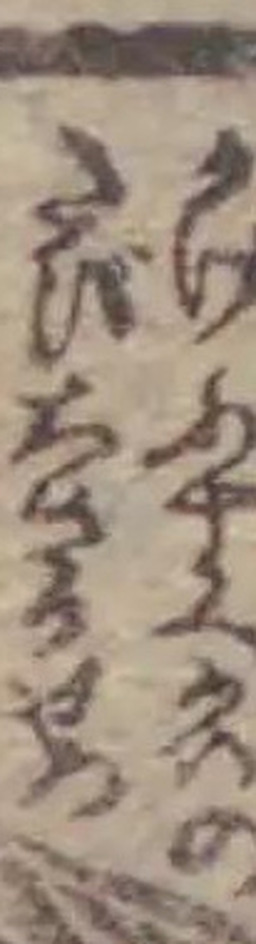たび大さかせつた
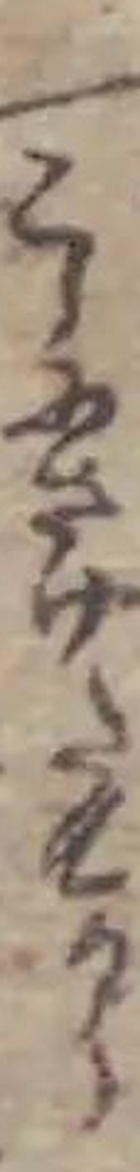こしにさけたてから
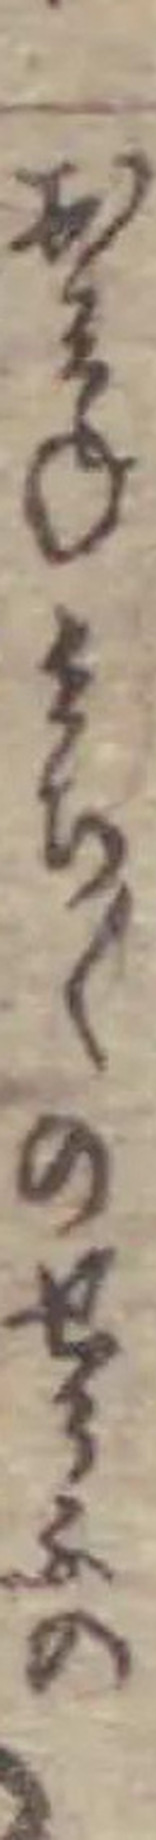おみねみち〳〵のせうふの
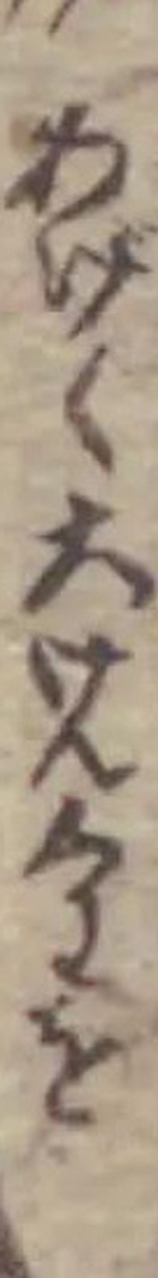あげく大けんくわを
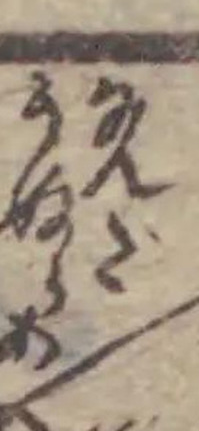うぬらあ
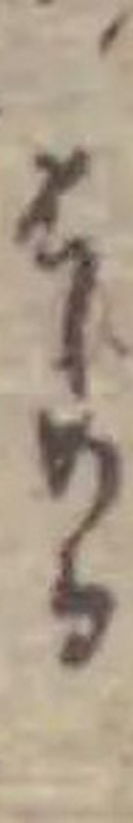はしめる
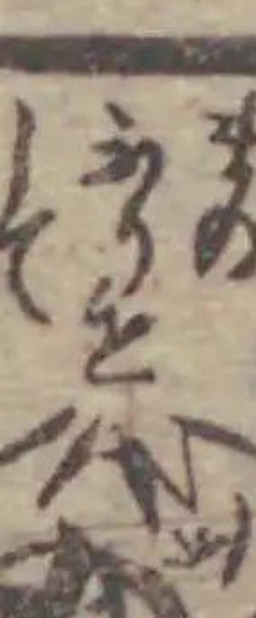ふりを
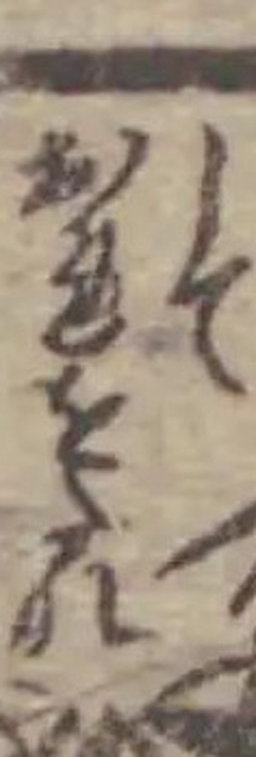おれをたれ
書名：飛た間違矢口噂 2巻
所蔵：国立国会図書館 National Diet Library, JAPAN
